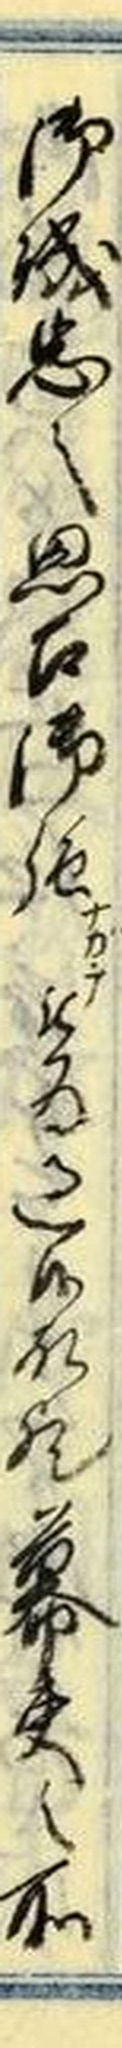御誠忠之思召御強ナガラ被為過候故歟幕吏之所
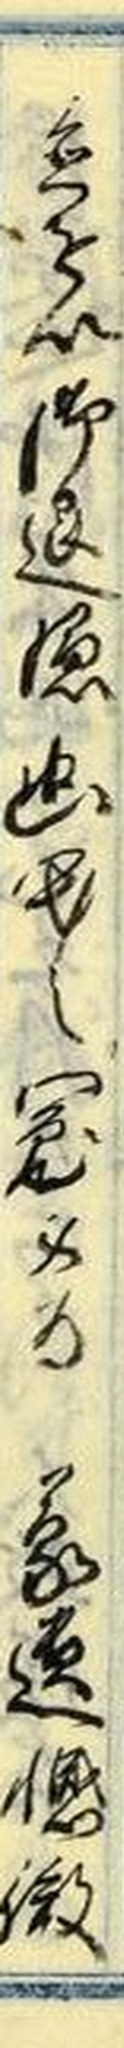置を以御退隠幽閉之冤被為蒙遺憾徹
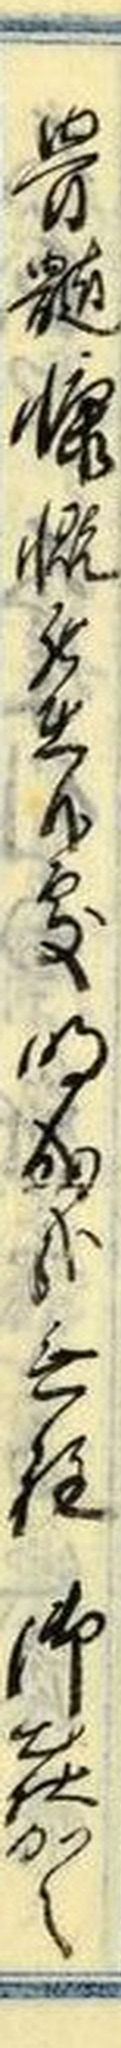骨髄慷慨被在候処明成哉無程御出仕加之
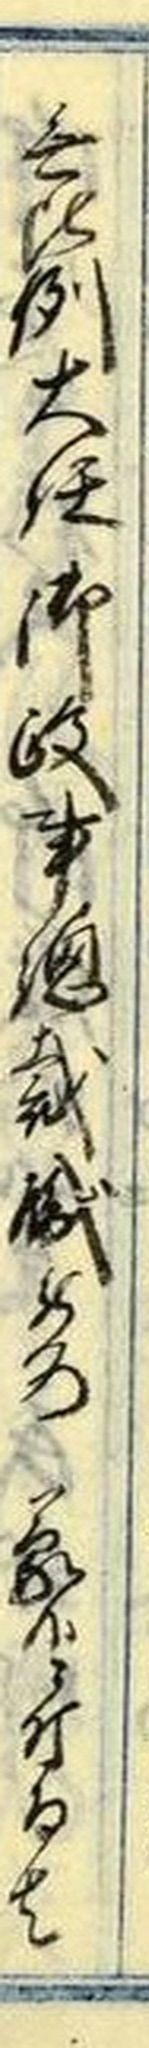無比例大任御政事総裁職被為蒙候ニ付而は
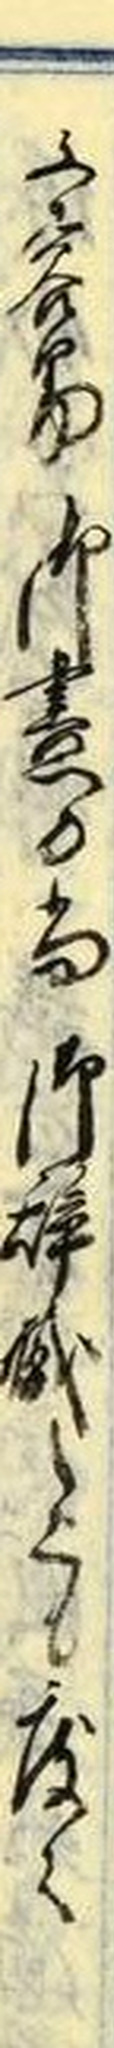不容易御尽力尚御拝職之上も度々
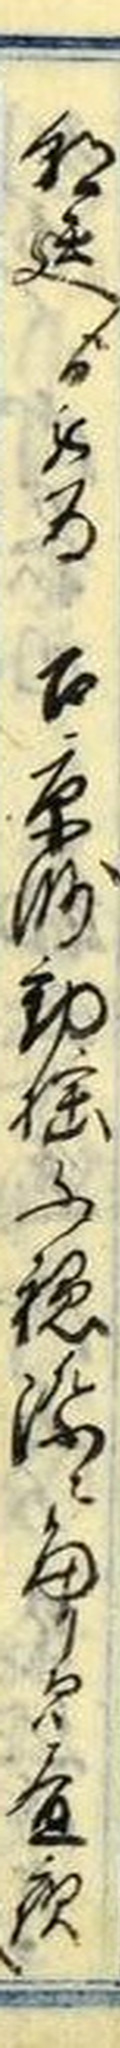朝廷ゟ被為召京師動揺不穏際ニ当り而ハ昼夜之

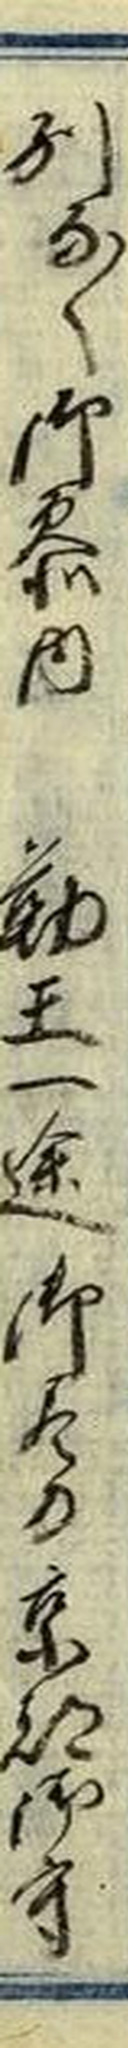別なく御参内勤王一途御尽力京都御守
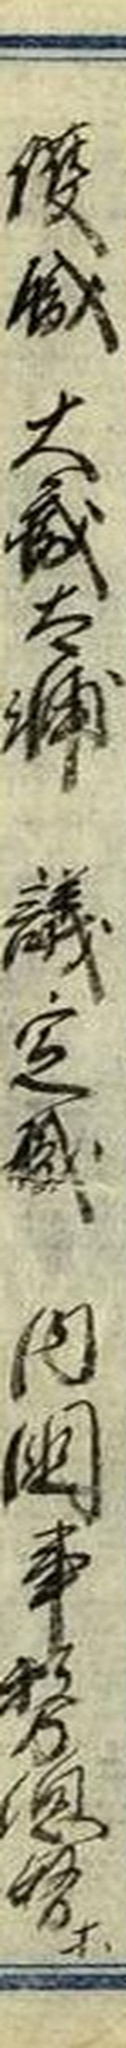護職大蔵太輔議定職内国事務総督等
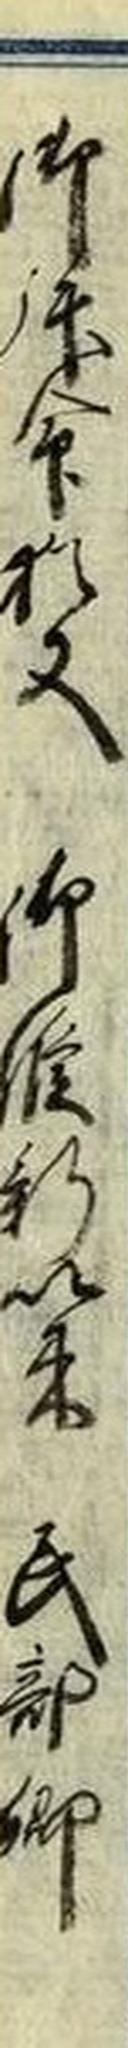御拝命猶又御維新以来民部卿
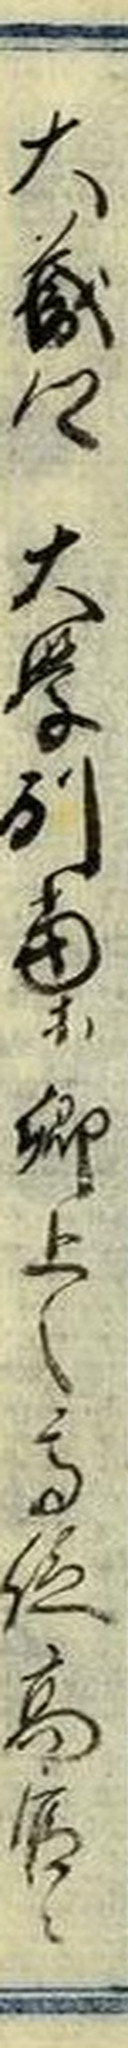大蔵卿大学別当等卿上之高位高官ニ
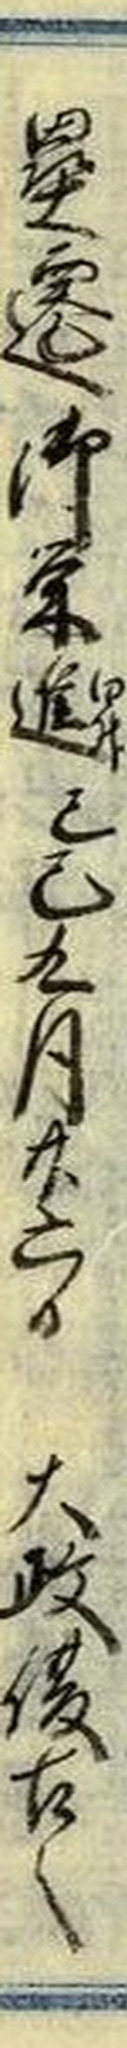塁遷御栄進己巳九月廿六日大政復古之
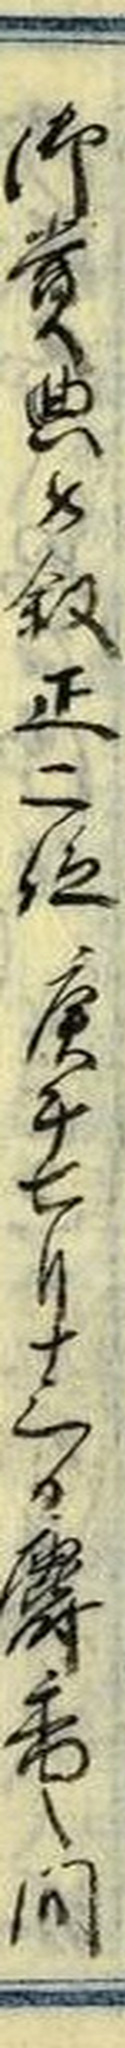御賞典被叙正二位庚午七月十三日麝香之間
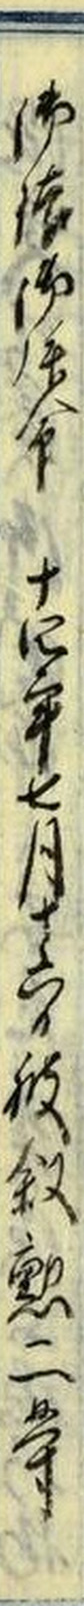御詰御拝命十四年七月十六日被叙勲二等
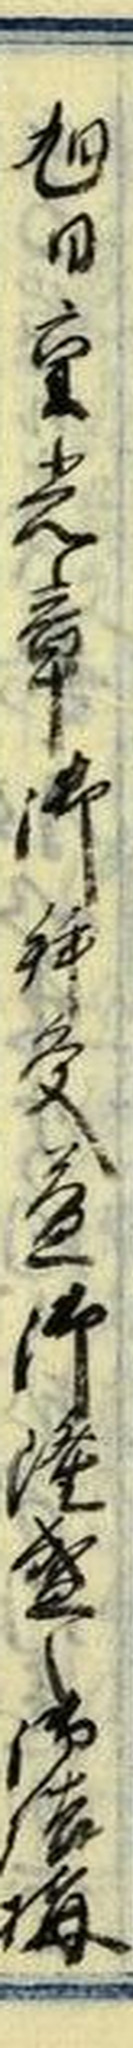旭日重光章御拝受益御隆盛之御結構
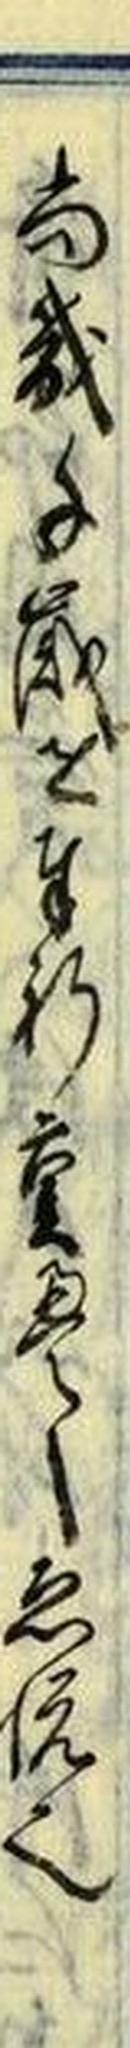尚幾千歳を奉祈重畳之恐悦也
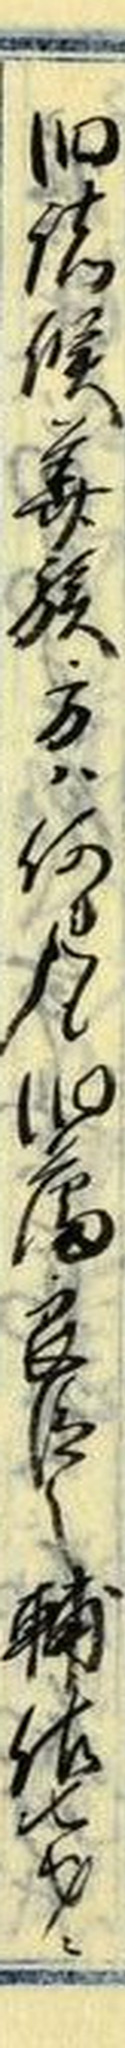旧諸侯華族方ハ何れも旧藩良臣之輔佐次第ニ
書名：温古集 三巻
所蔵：福井県文書館 Fukui Prefectural Archives
